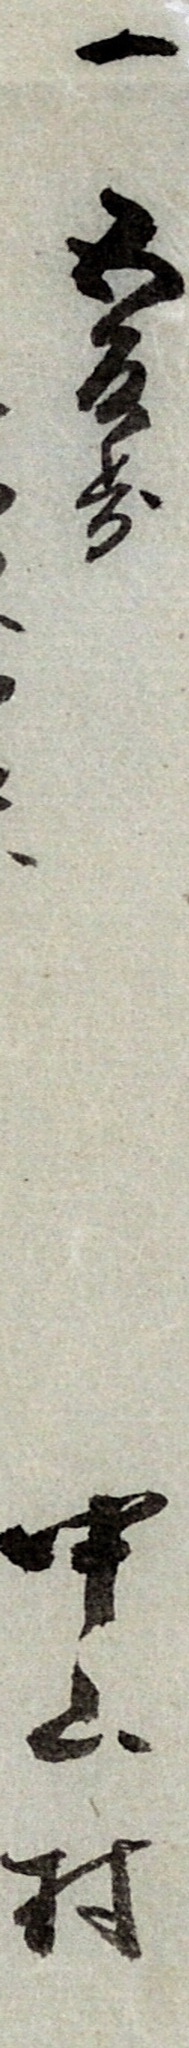一五反歩中山村
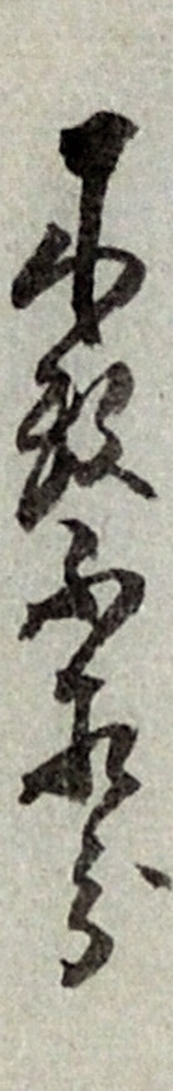木数不相分
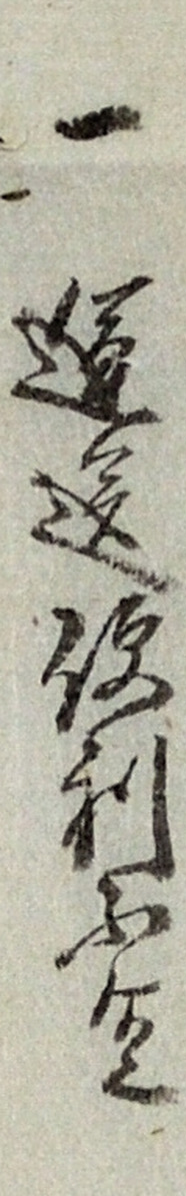一運送便利不宜
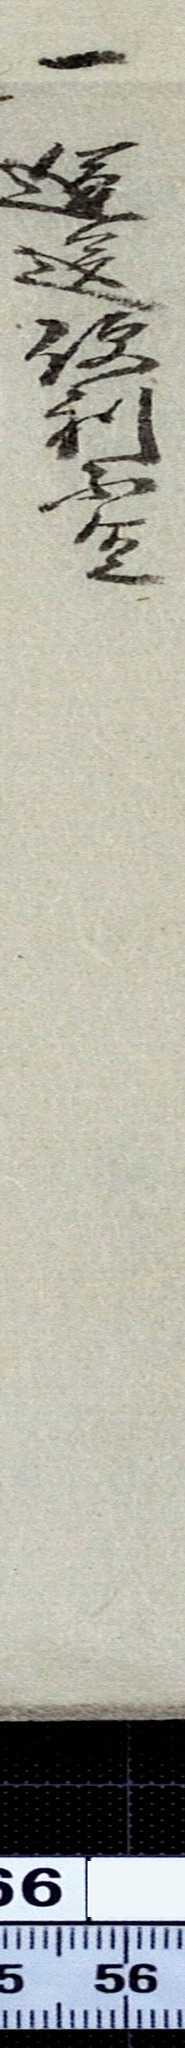一運送便利不宜
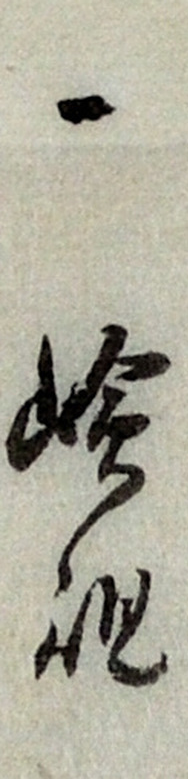一嶮岨
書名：官林反別帳
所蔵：伊那市立高遠町図書館・合同会社AMANE
